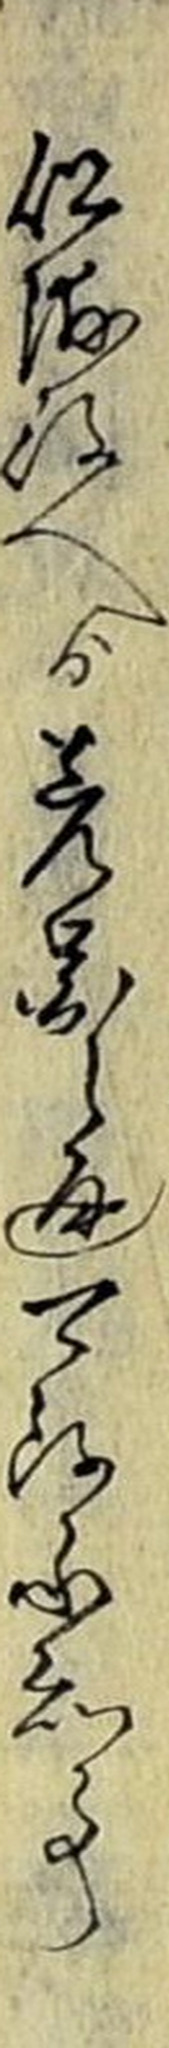但浦役人ゟ差図之通可致承知事
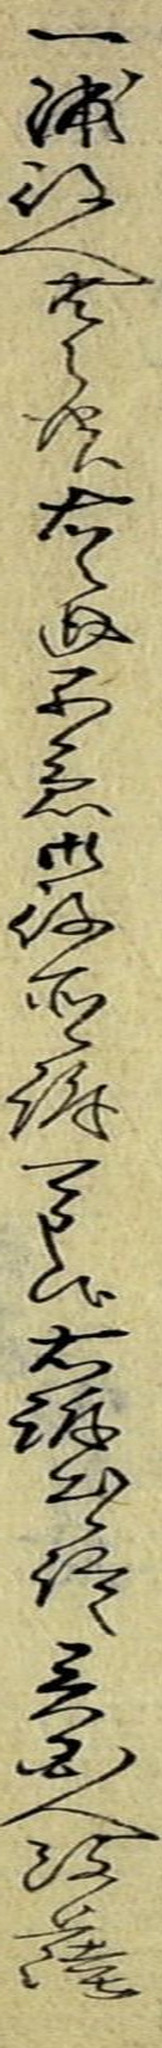一浦役人共之儀は右之趣早急御役所へ訴可申候右訴出候跡へ異国人致上陸
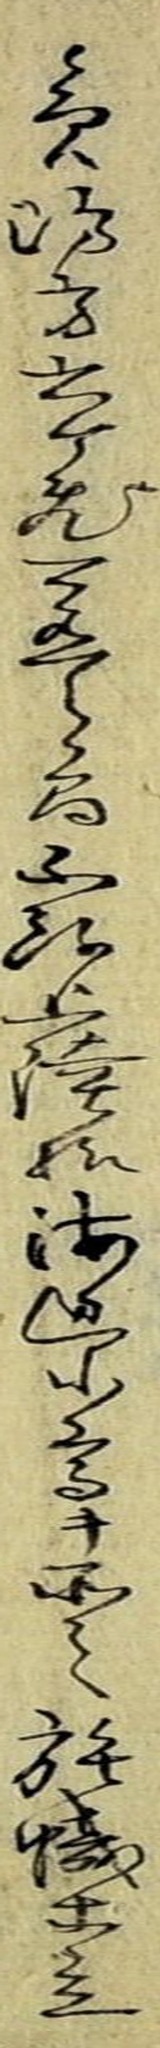候而は防方六ヶ敷可有之候間不致上陸候様浦辺小高キ所々へ旗幟等立
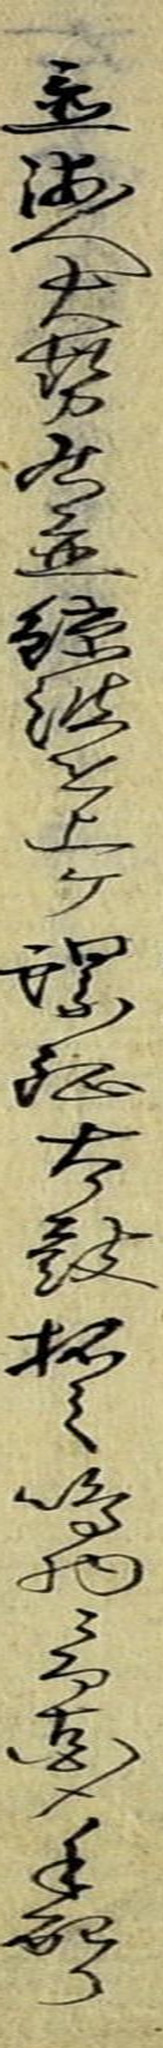置浦人大勢居並鯨波を上ヶ螺鉦太鼓抔之鳴物に而固メ手配り
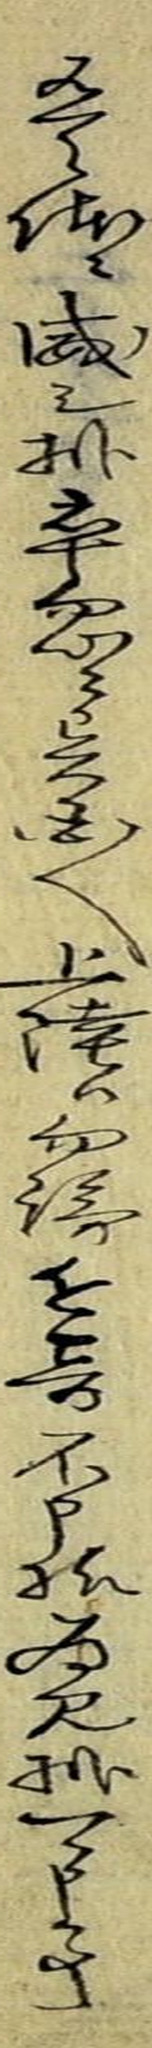有之体に威し掛卒忽に異国人上陸は勿論近寄不申様為見掛可申事
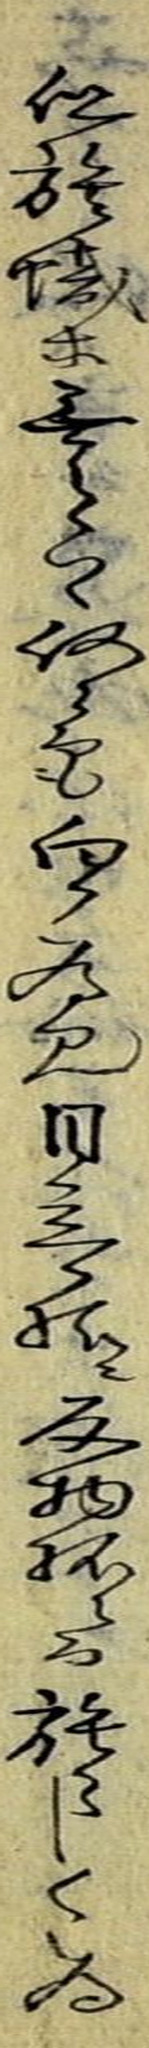但旗幟等無之候はヽ何に而も白ク為見目立候様に反物抔に而旗らしく為
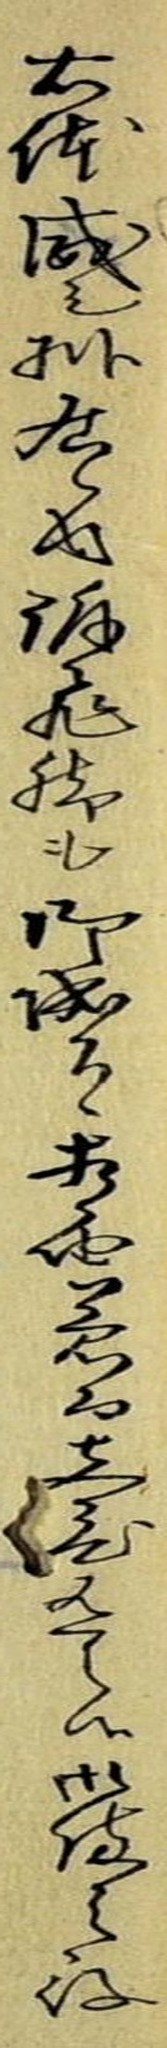右体威し掛居候内訴飛脚も御城下へ相届兼而支度有之候御備之役
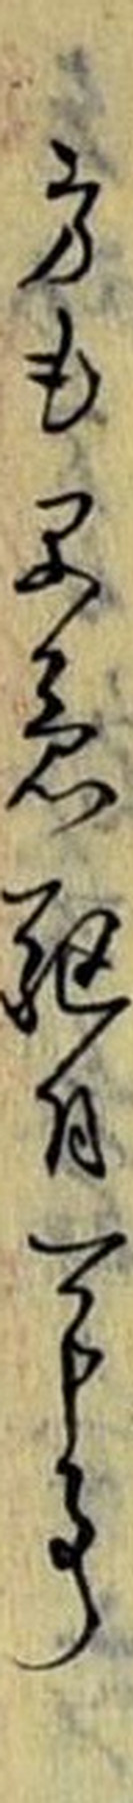方も早急馳付可申事
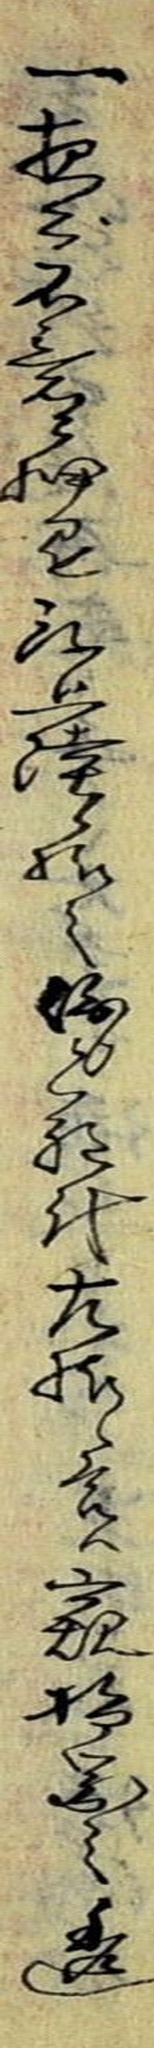一夜分不意に押懸致上陸候様之例も難計左様之節は窺指図之手廻
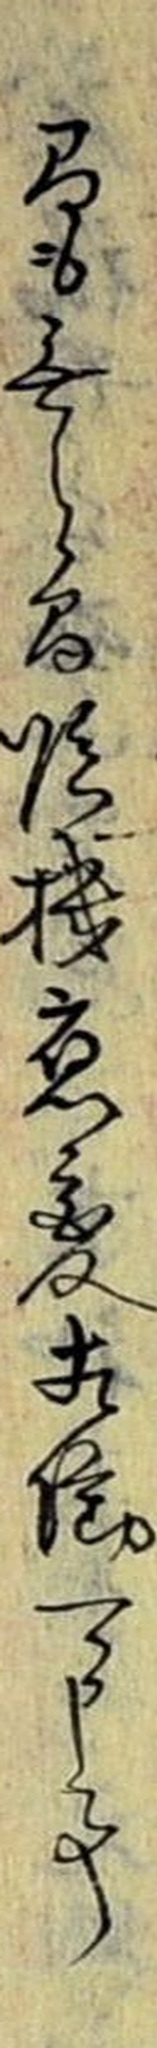間も無之候間臨機応変相働可申事
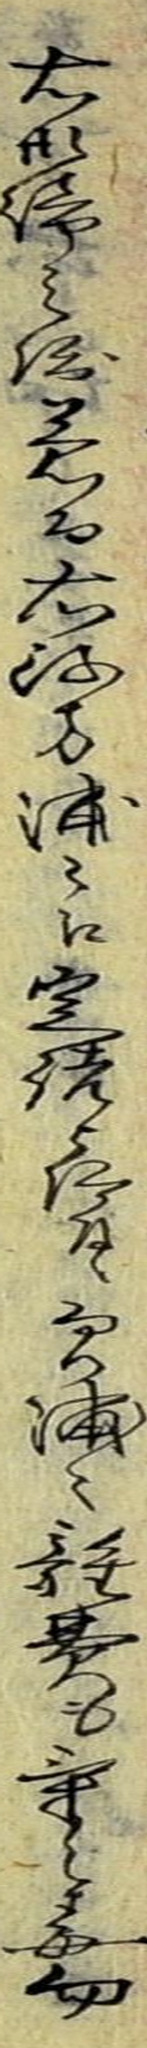右御締之儀兼而右致方浦々江定詰被仰付候而は浦々雑費も気之毒勿
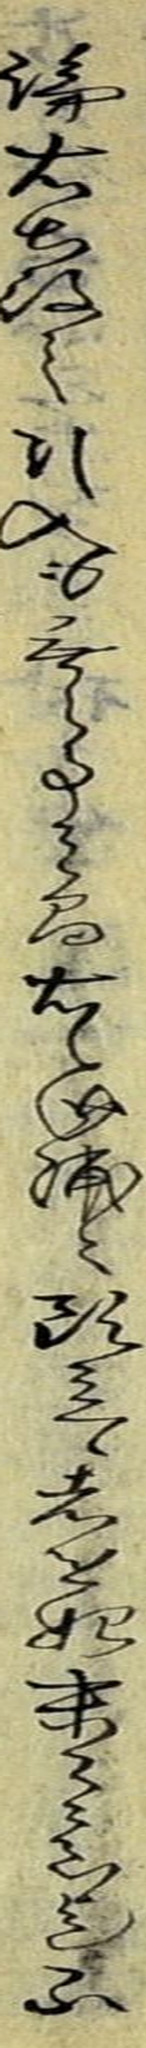論右出役之引入も無之事に候間右之趣浦々頭立之者を始末々に至迄不
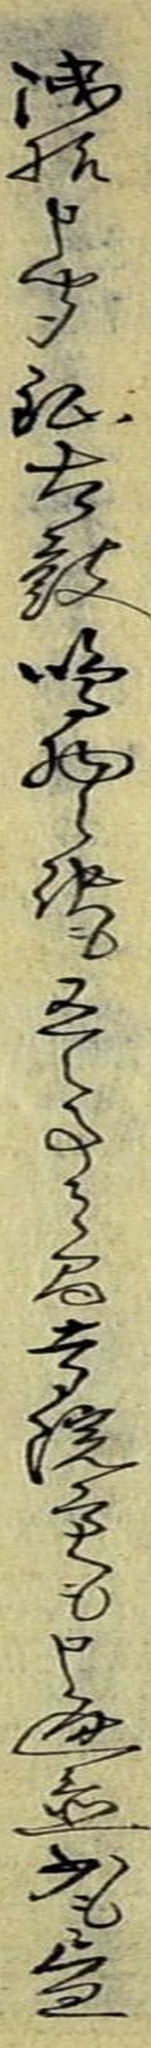洩様申聞鉦太鼓鳴物之訳も有之事に候間寺院方用へも申通置少も昼
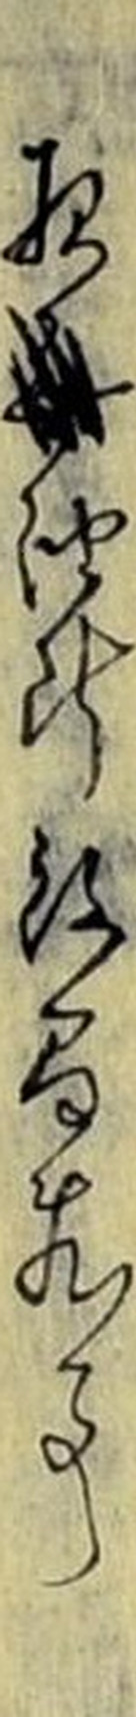夜由断致間敷事
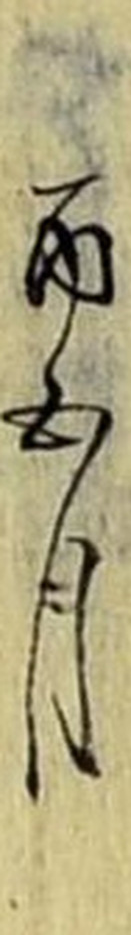酉五月
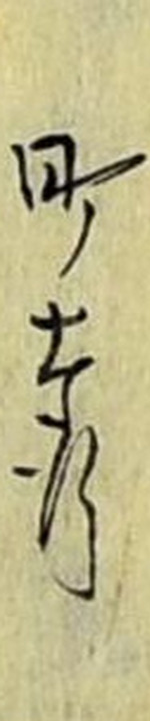町奉行
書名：命令之部 四
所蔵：福井県文書館 Fukui Prefectural Archives
